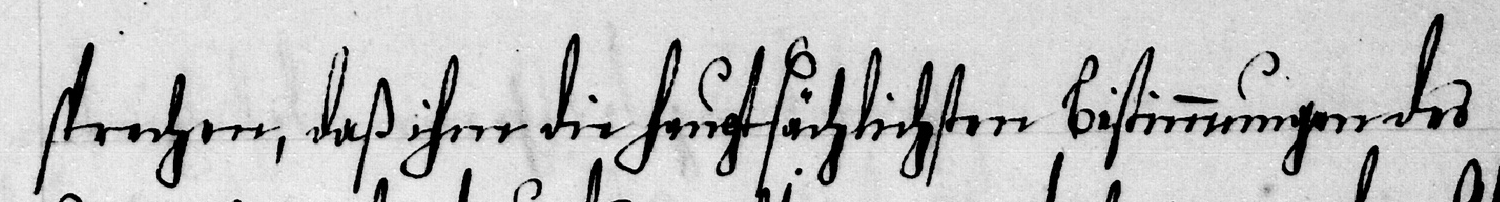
sprechen, daß ihm die hauptsächlichsten Bestimmungen
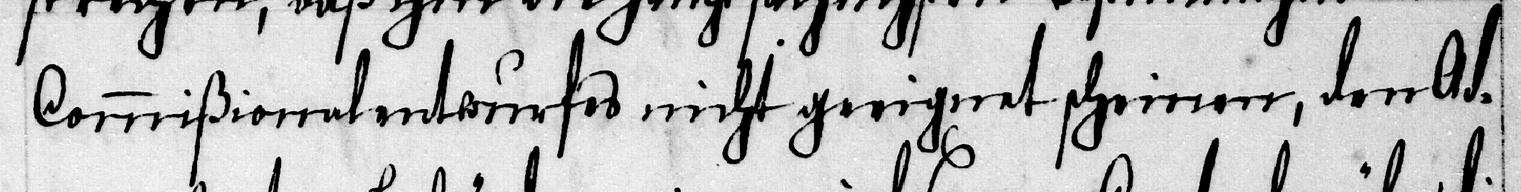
Commißionalentwurfes nicht geeignet scheinen, den Ad¬
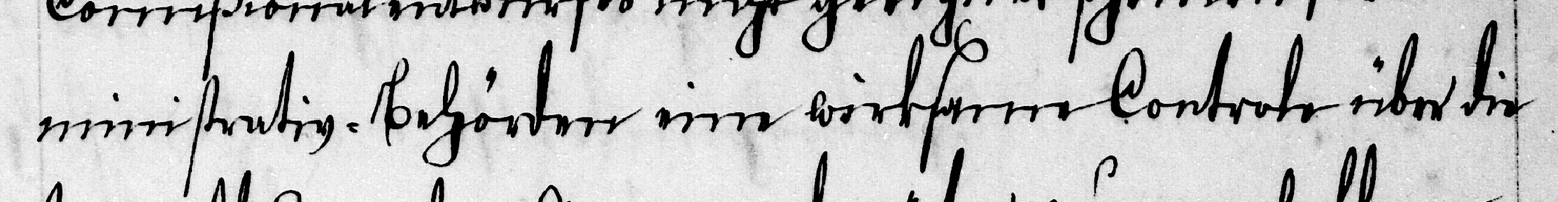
ministrativ-Behörden eine wirksame Controle über die
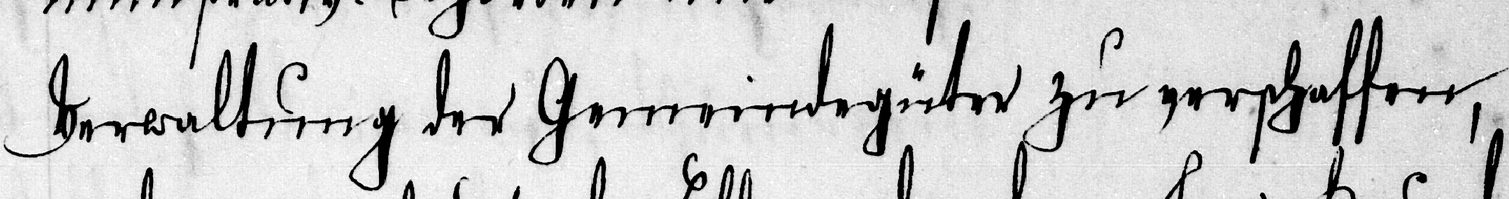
Verwaltung der Gemeindegüter zu verschaffen,
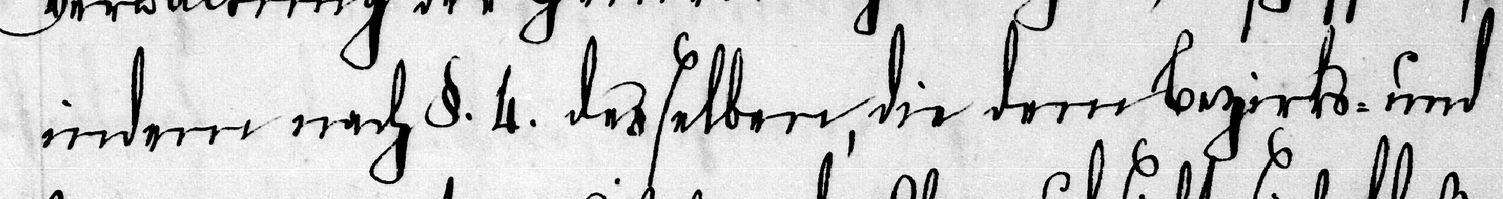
indem nach §. 4. desselben, die dem Bezirks- und
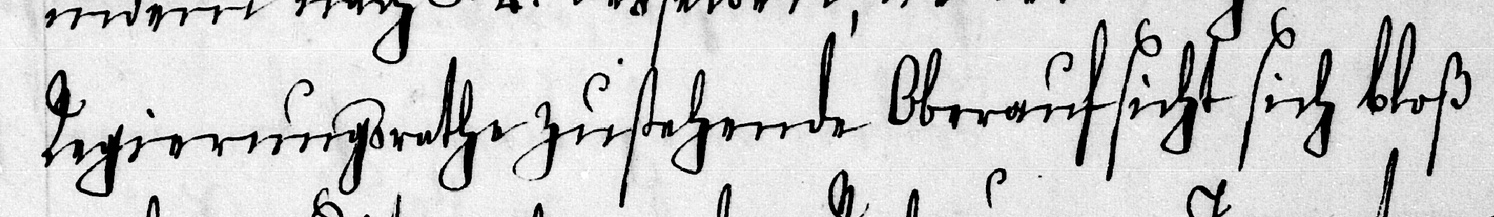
Regierungsrathe zustehende Oberaufsicht sich bloß
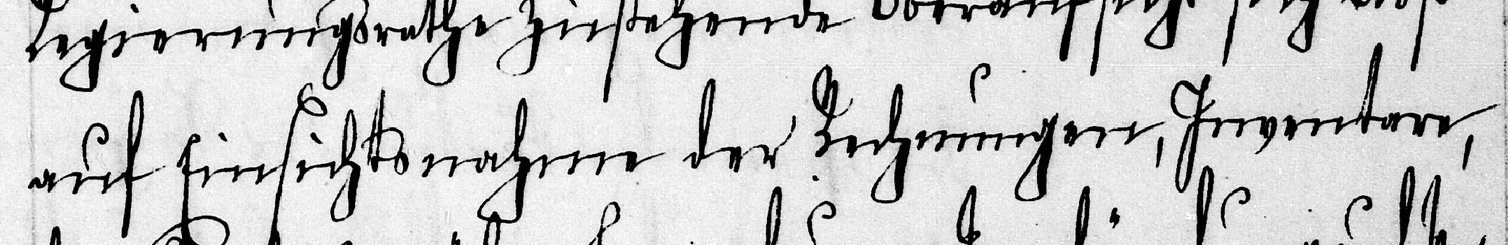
auf Einsichtsnahme der Rechnungen, Inventare,
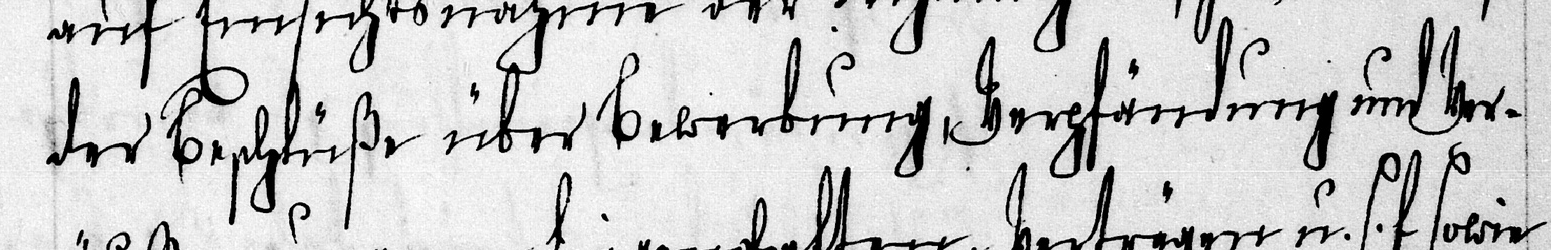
der Beschlüße über Bewerbung, Verpfändung und Ver¬
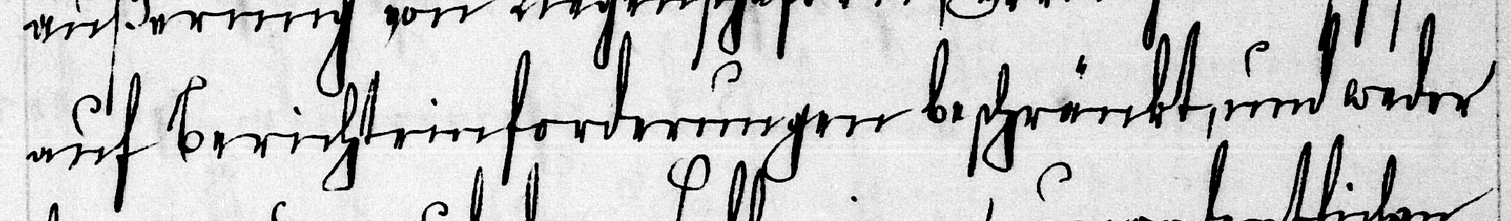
auf Berichteinforderungen beschränkt, und weder
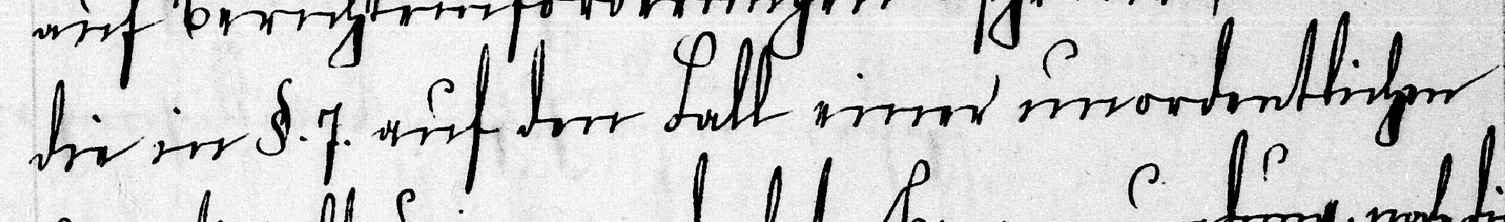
die in §. 7. auf den Fall einer unordentlichen
